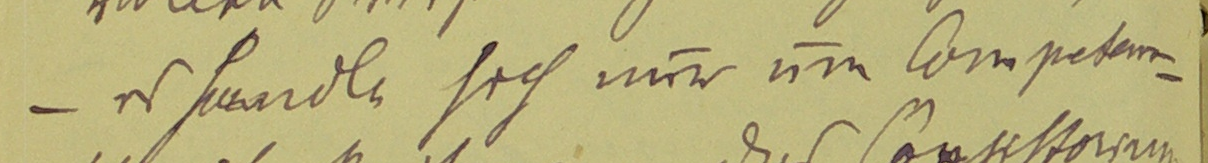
- es handle sich nur um Competenz¬
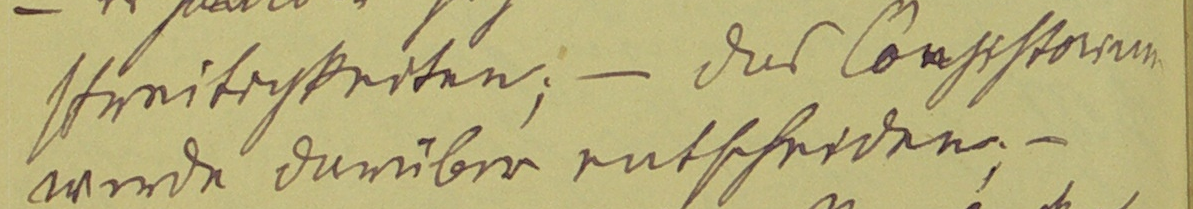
streitigkeiten, – das Consistorium
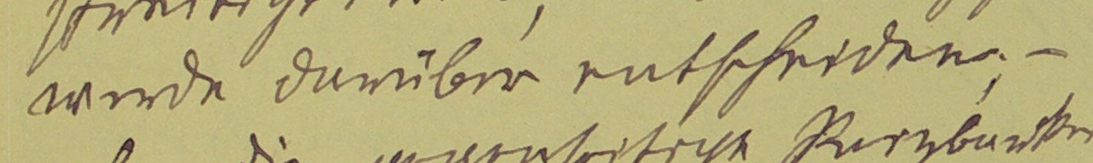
werde darüber entscheiden; -
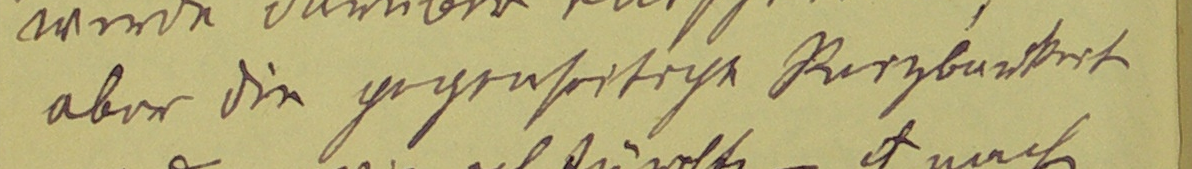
aber die gegenseitige Reizbarkeit
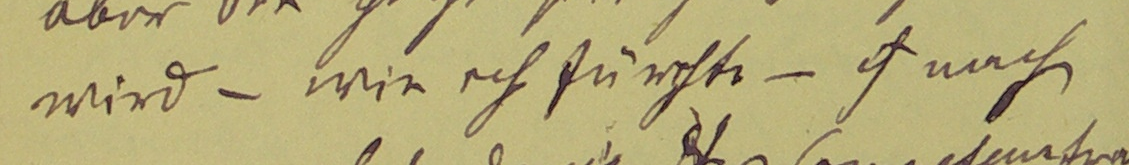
wird - wie ich fürchte - auch nach
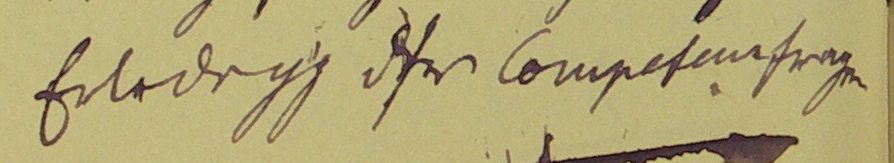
Erledigung der Competenzfragen
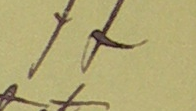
77
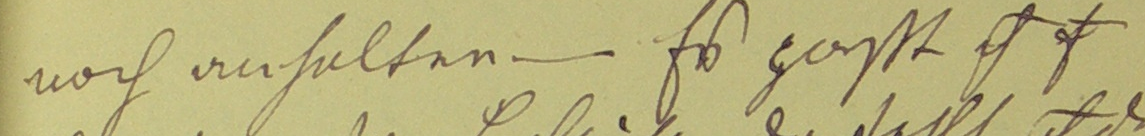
noch anhalten. - Es paßt auch auf
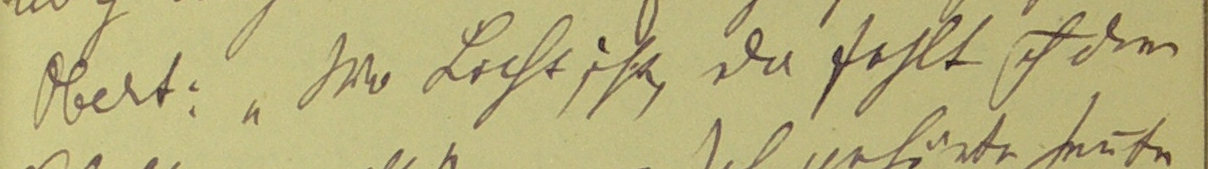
Obert: “ Wo Licht ist da fehlt auch der
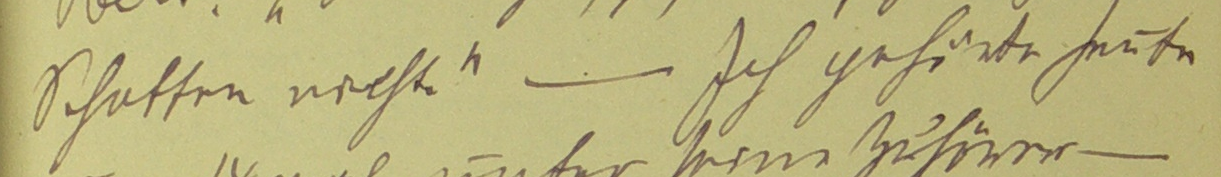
Schatten nicht“.- Ich gehörte heute
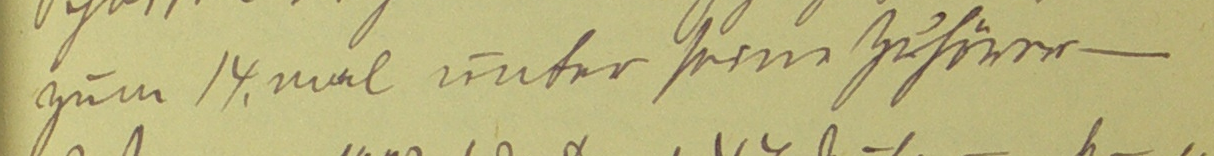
zum 14. mal unter seine Zuhörer.—
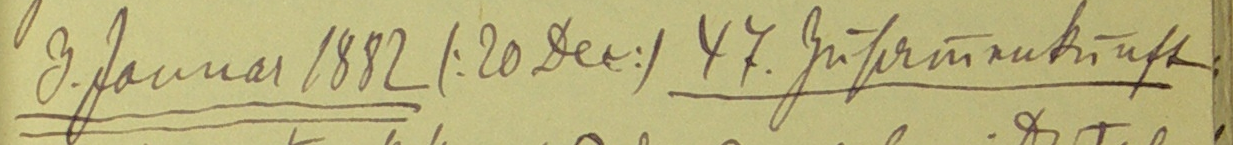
3. Januar 1882 (20 Dez): 47. Zusammnekunft
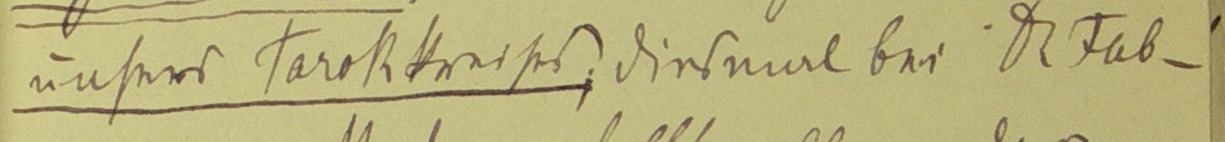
unseres Tarokkreises. Diesmal bei Dr. Fab¬
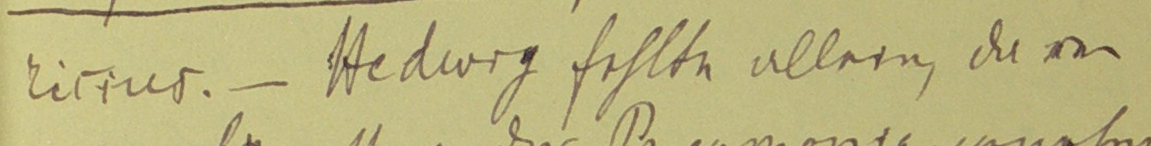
ricius.- Hedwig fehlte allein, da er
